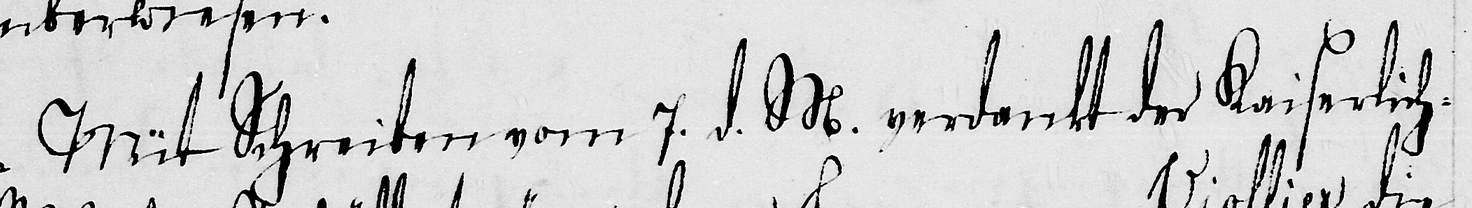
Mit Schreiben vom 7. d. M. verdankt der Kaiserlic¬
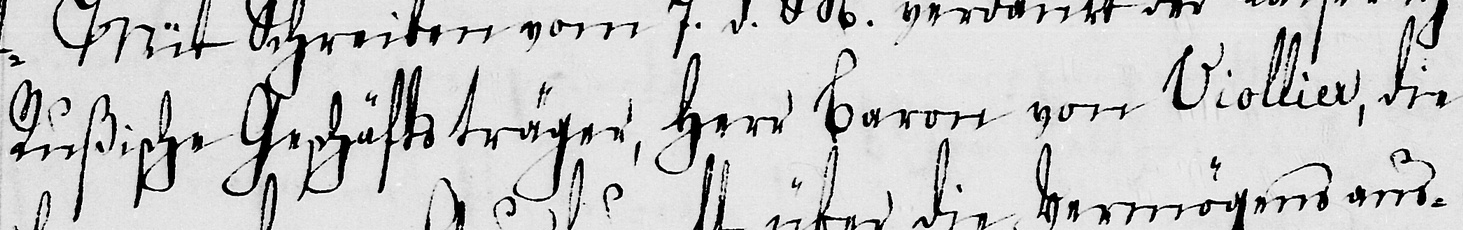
ußische Geschäftsträger, Herr Baron von Viollier, die
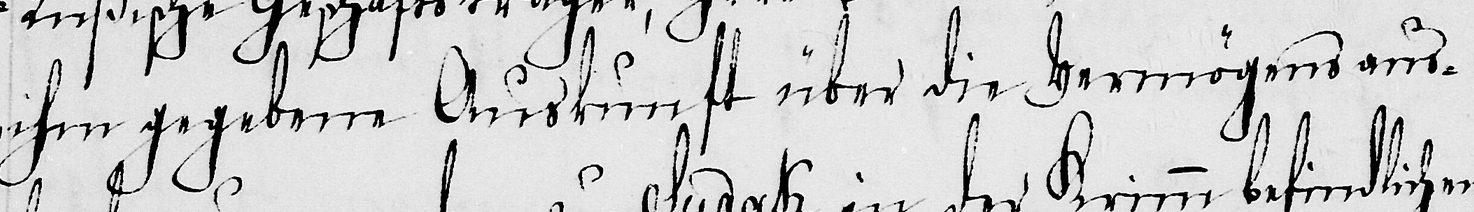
ihm gegebene Auskunft über die Vermögensaus¬
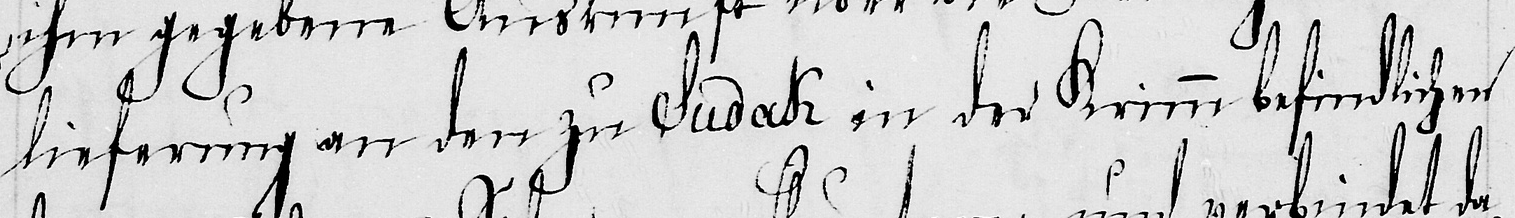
lieferung an den zu Sudak in der Krim befindlichen
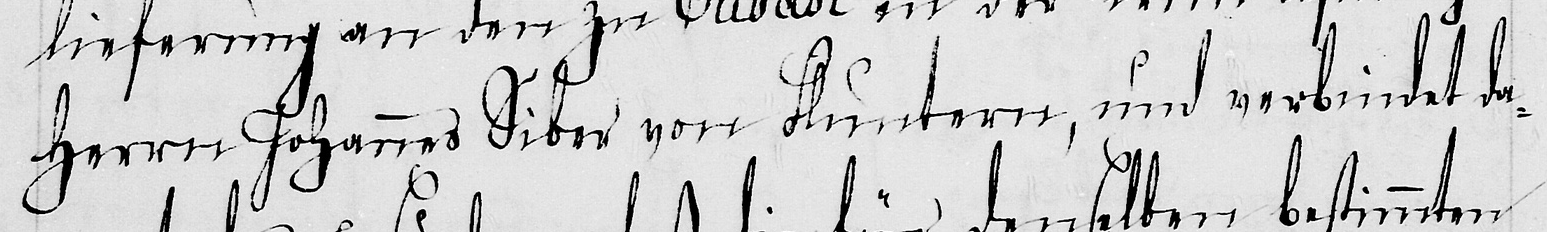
Herrn Johannes Siber von Fluntern, und verbindet da¬
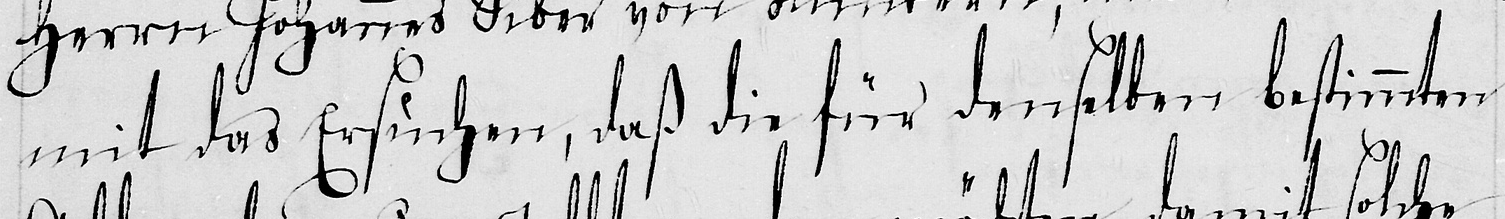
mit das Ersuchen, daß die für denselben bestimmten
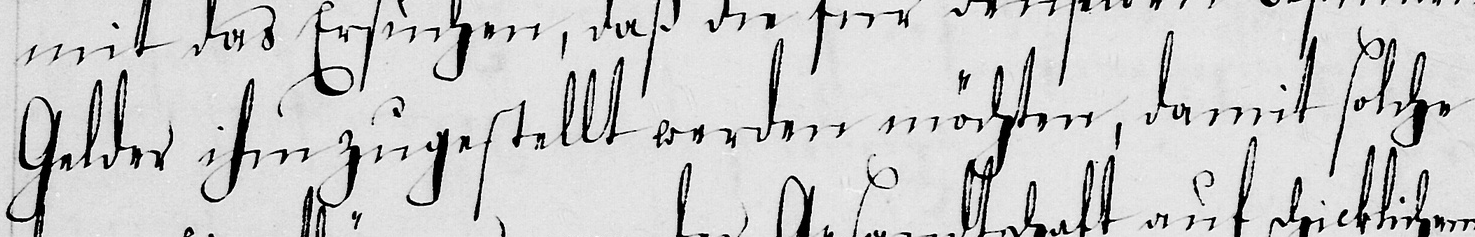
Gelder ihm zugestellt werden möchten, damit solche
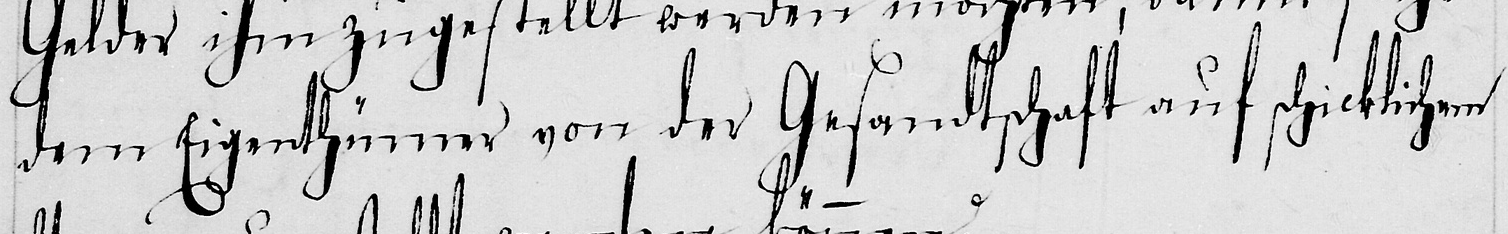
dem Eigenthümer von der Gesandtschaft auf schicklichem
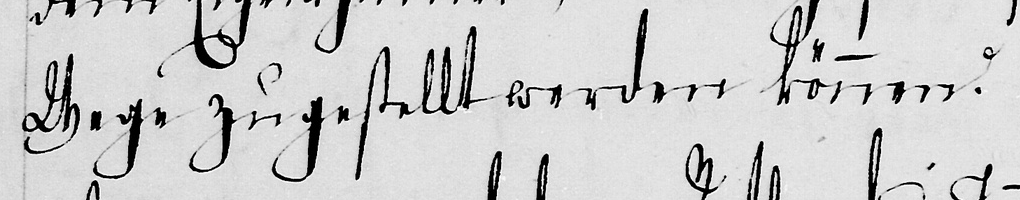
Wege zugestellt werden können.
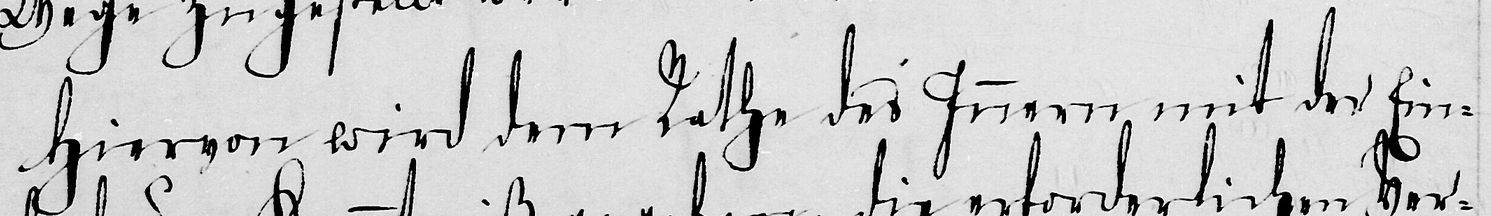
Hiervon wird dem Rathe des Innern mit der Ein¬
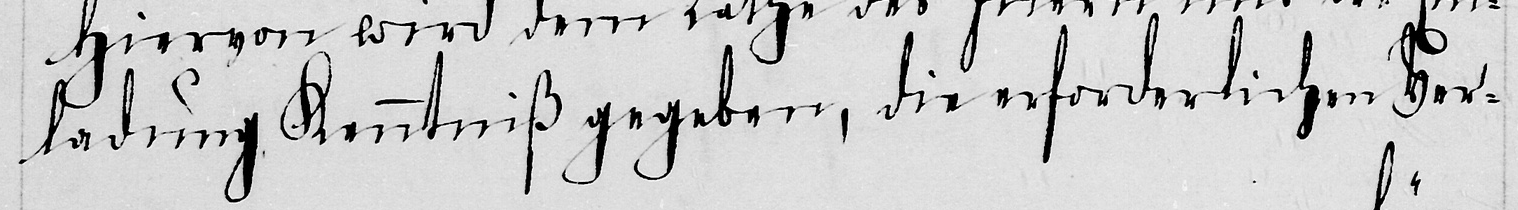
ladung Kenntniß gegeben, die erforderlichen Ver-
